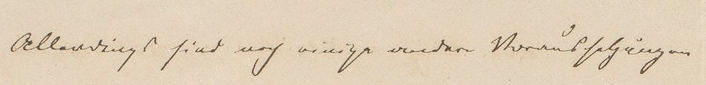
Allerdings sind noch einige andere Voraussetzungen
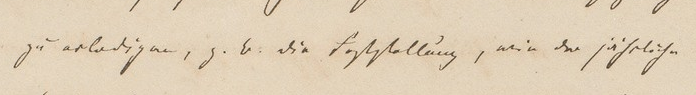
zu erledigen, z. B. die Feststellung, wie der jährliche
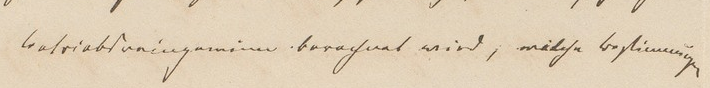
Betriebsreingewinn berechnet wird, welche Bestimmungen
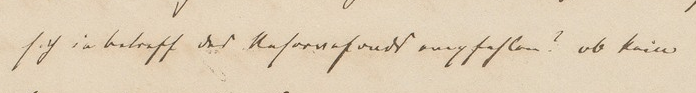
sich in Betreff des Reservefonds empfehlen? ob kein
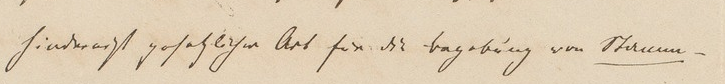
Hinderniß gesetzlicher Art für die Begebung von Stamm -
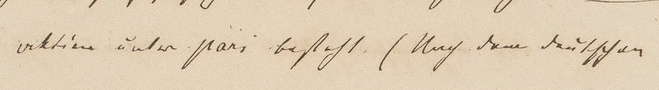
aktien unter pari besteht (Nach dem deutschen
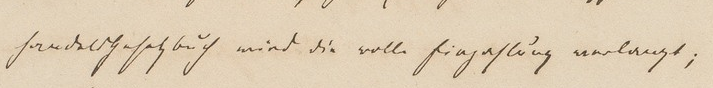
HandelsGesetzbuch wird die volle Einzahlung verlangt;
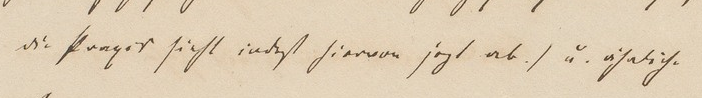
die Praxis sieht indeß hiervon jezt ab.) u. ähnliche
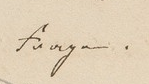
Fragen.
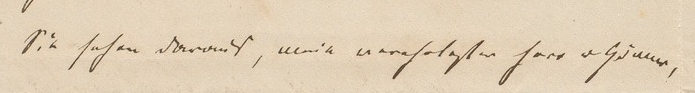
Sie sehen daraus, mein verehrtester Herr u Gönner,
